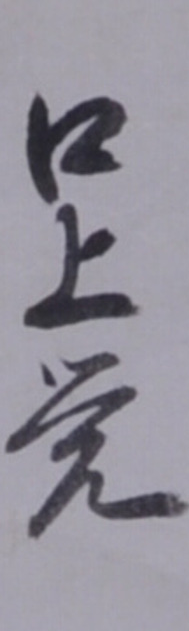口上覚
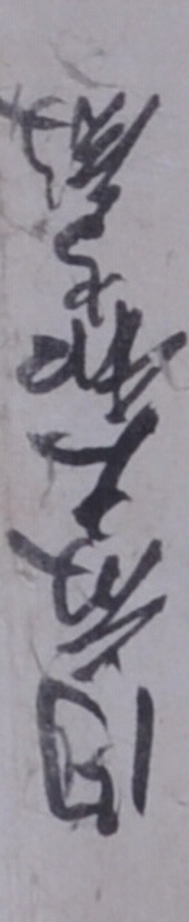進之候以上
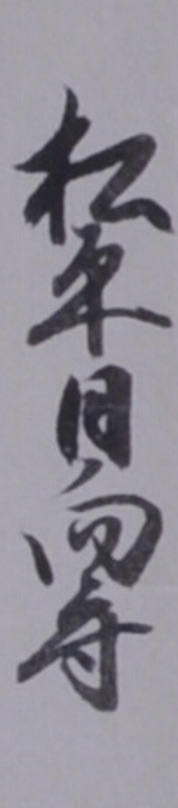松平日向守
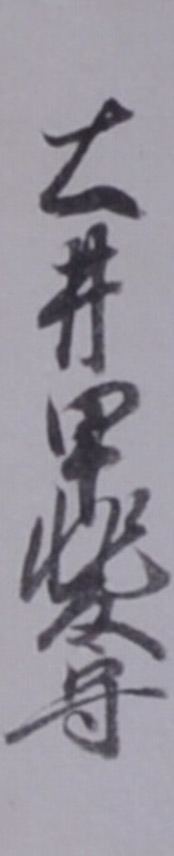土井甲斐守
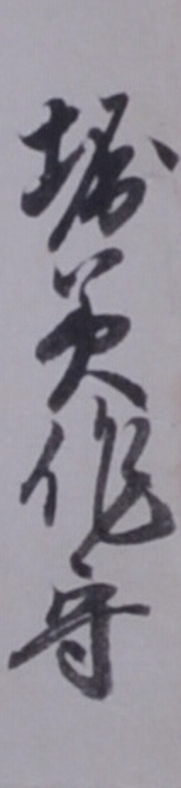堀美作守
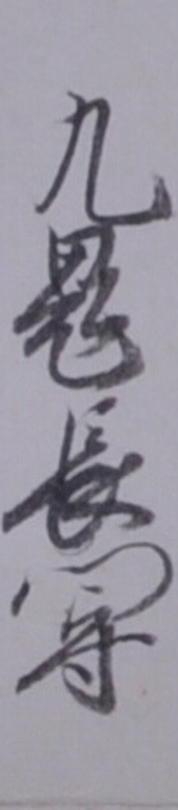九鬼長門守
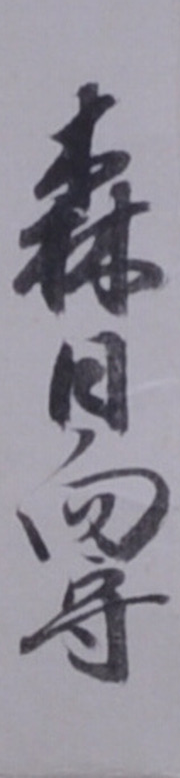森日向守
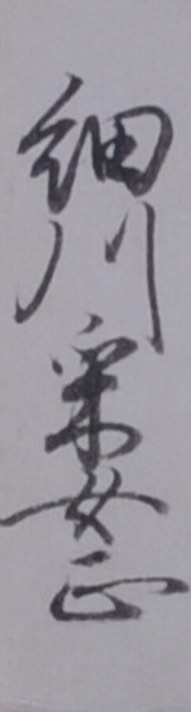細川采女正
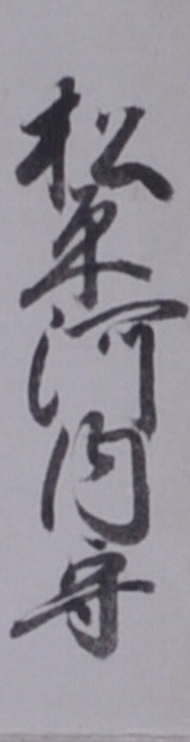松平河内守
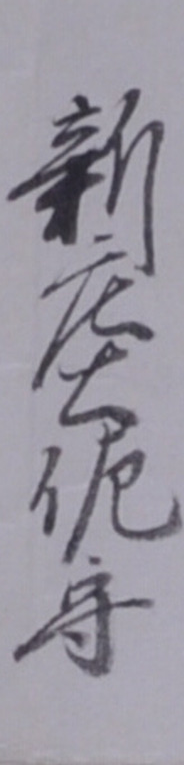新庄土佐守
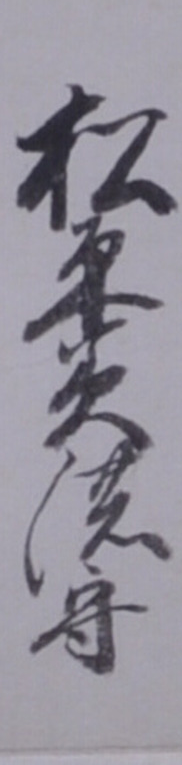松平美濃守
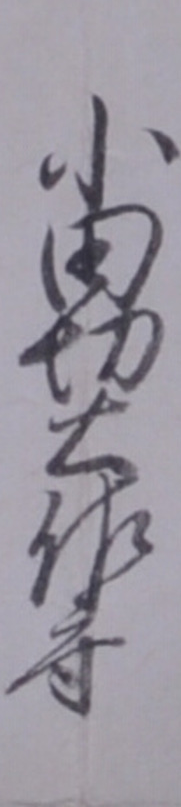小田切土佐守
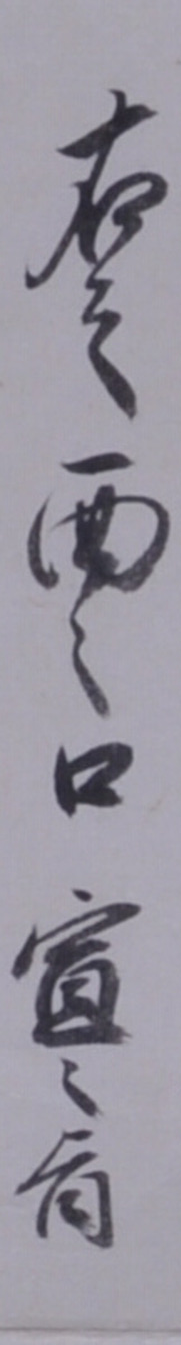右之面々口宣之旨
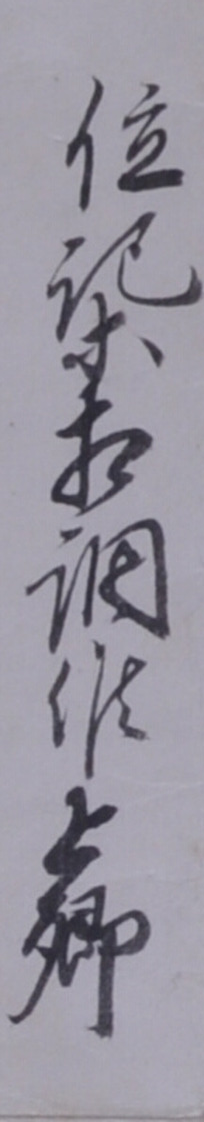位記等相調候上卿
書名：口上覚
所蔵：伊那市立高遠町図書館・合同会社AMANE
